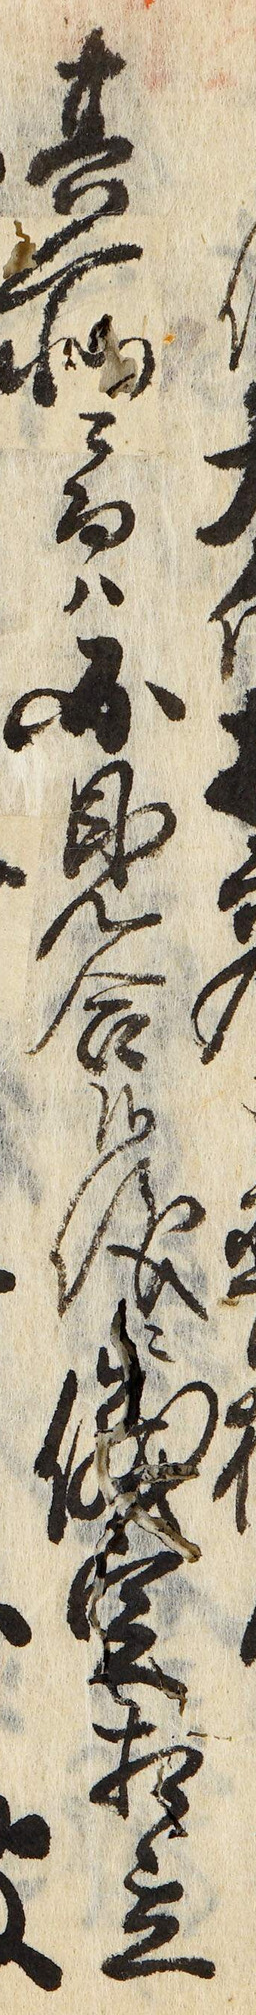其処ニ而ハ亦見合候儀ニ儀定相立
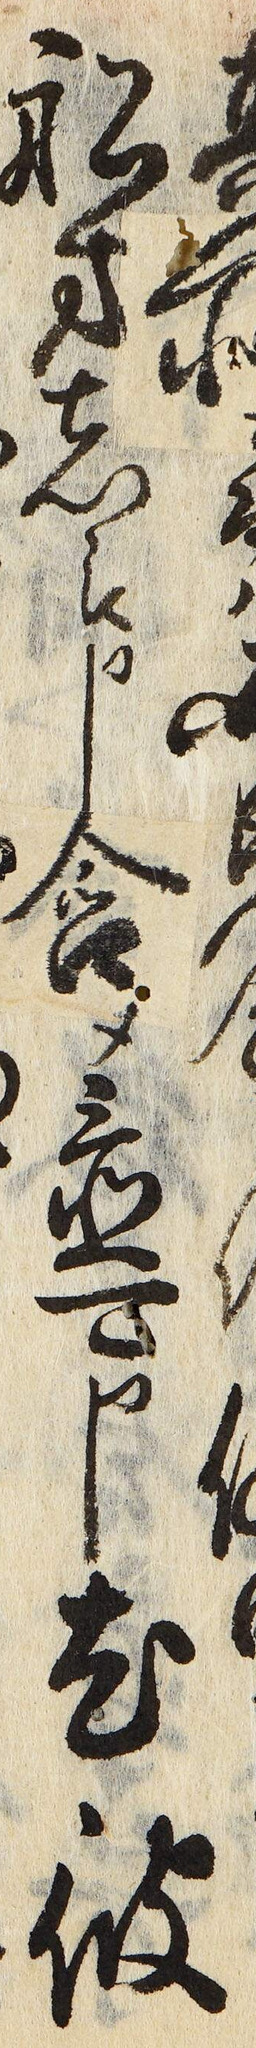船方者江申含メ置可申尤彼
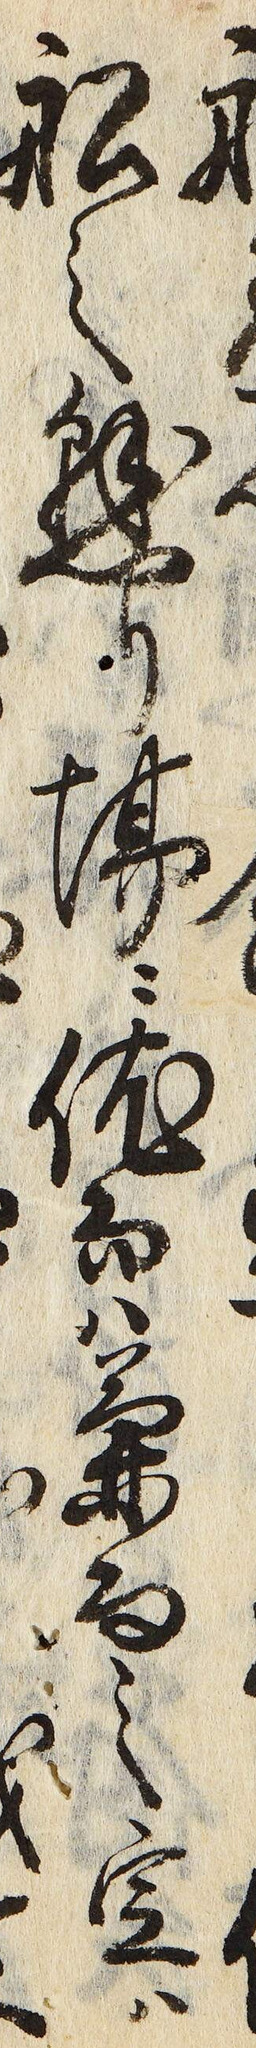船之懸り場ニ依而ハ兼而之定ハ
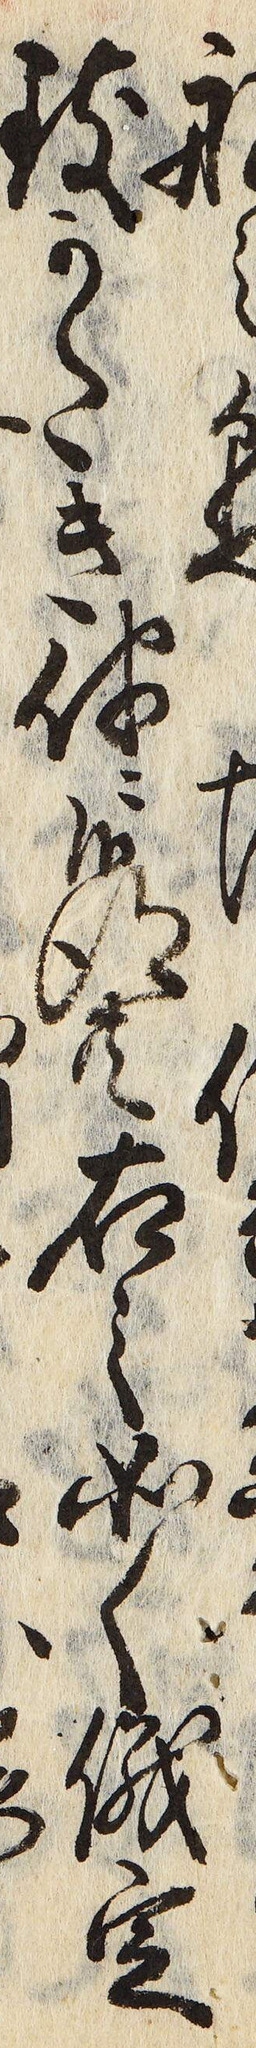致かたき儀ニ候得共右之如く儀定
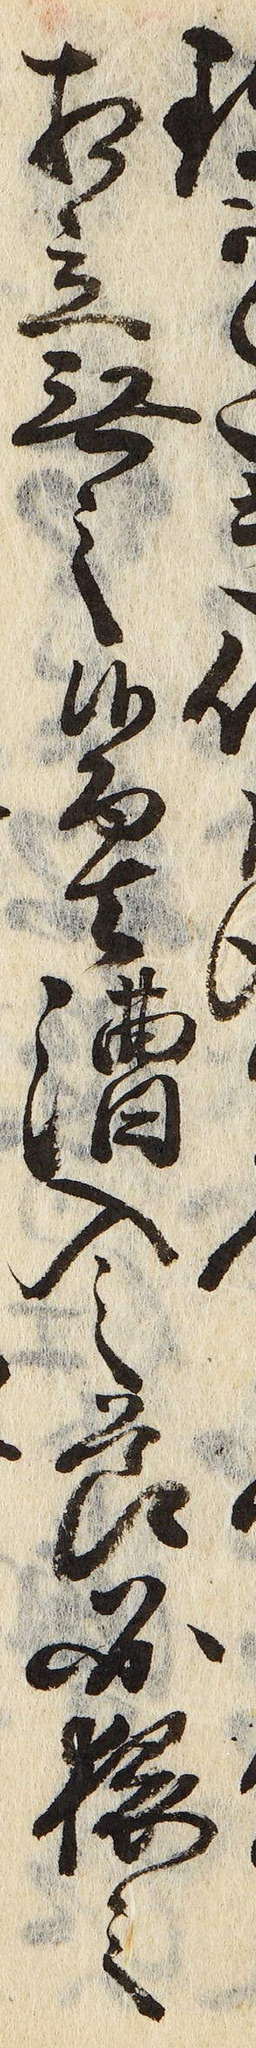相立無之候而者漕入之節亦猥之
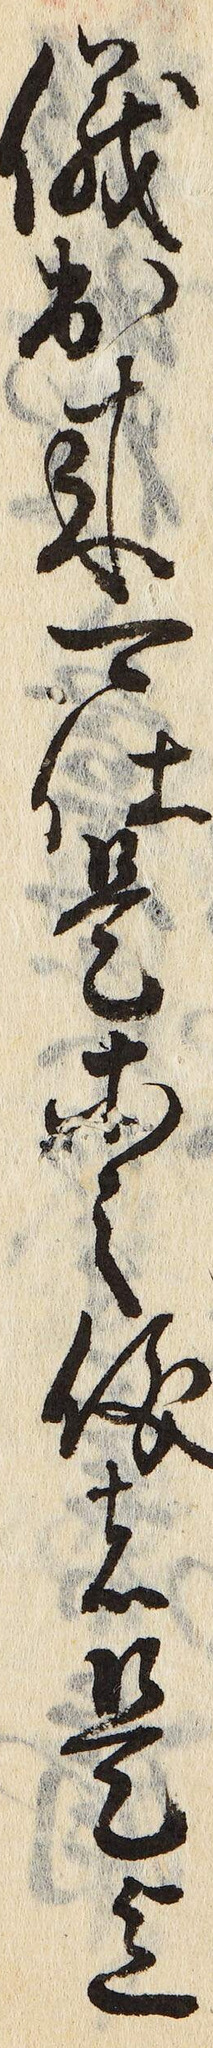儀出来可仕是等之儀者是迄
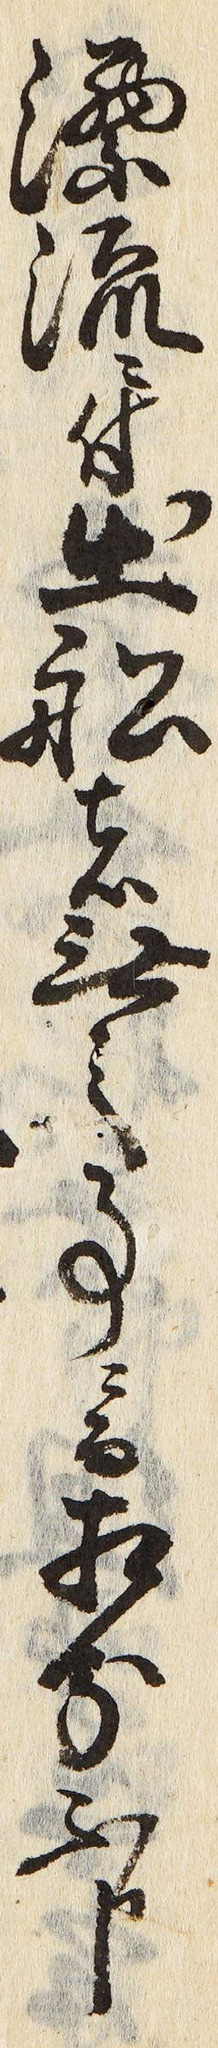漂流ニ付出船者無之事ニ而相分不申
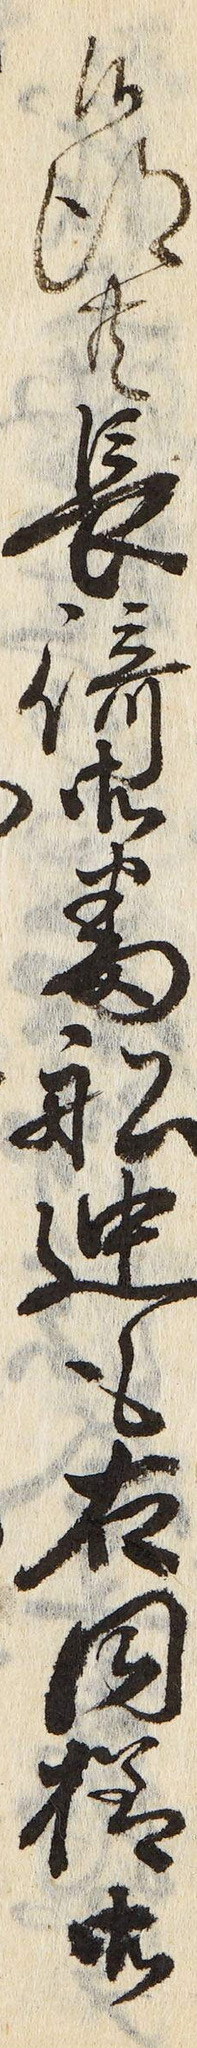候得共長崎御番船迚も右同様御
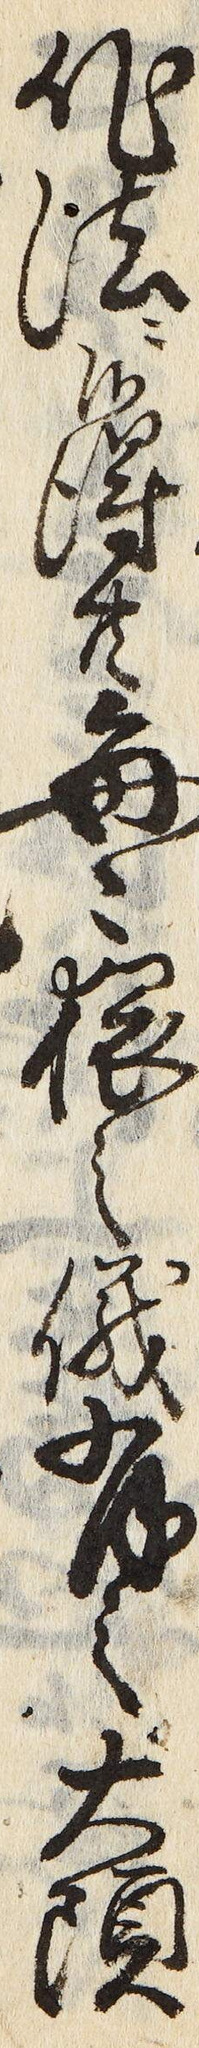作法ニ候得共毎々猥之儀有之大頭
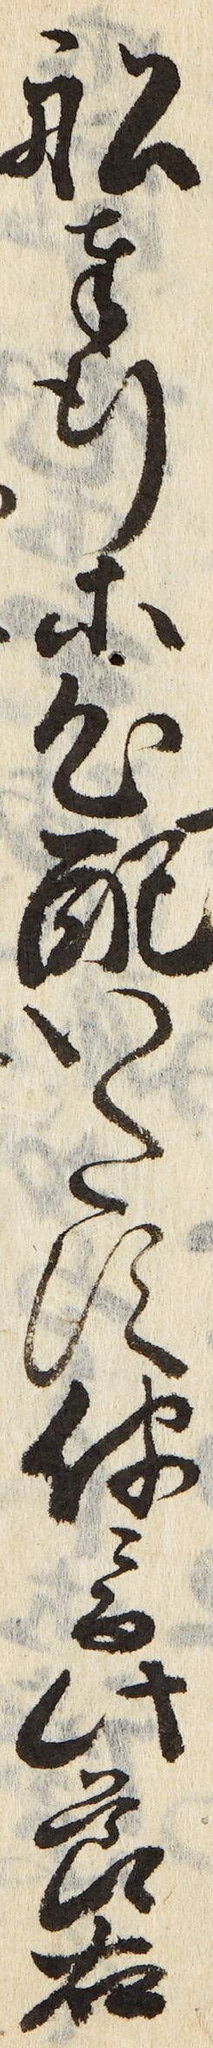船奉行等心配いたす儀ニ而此節右
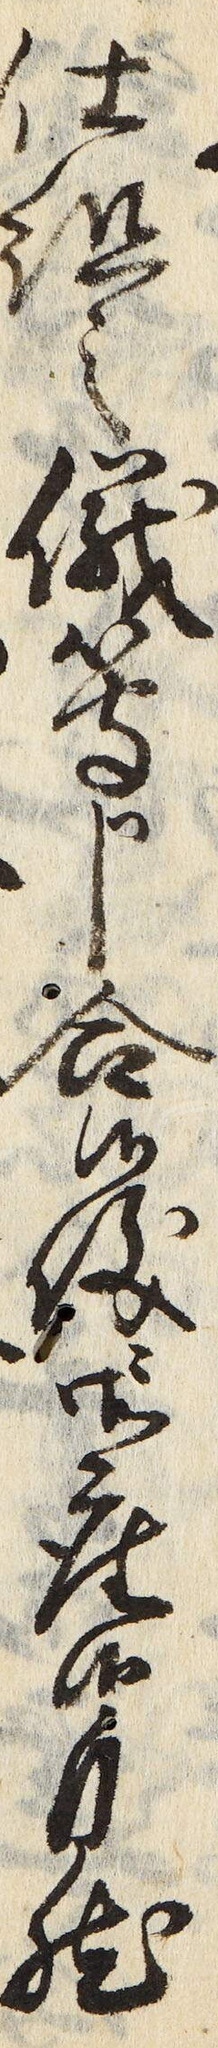仕組之儀等申合候儀ニ御座候自然
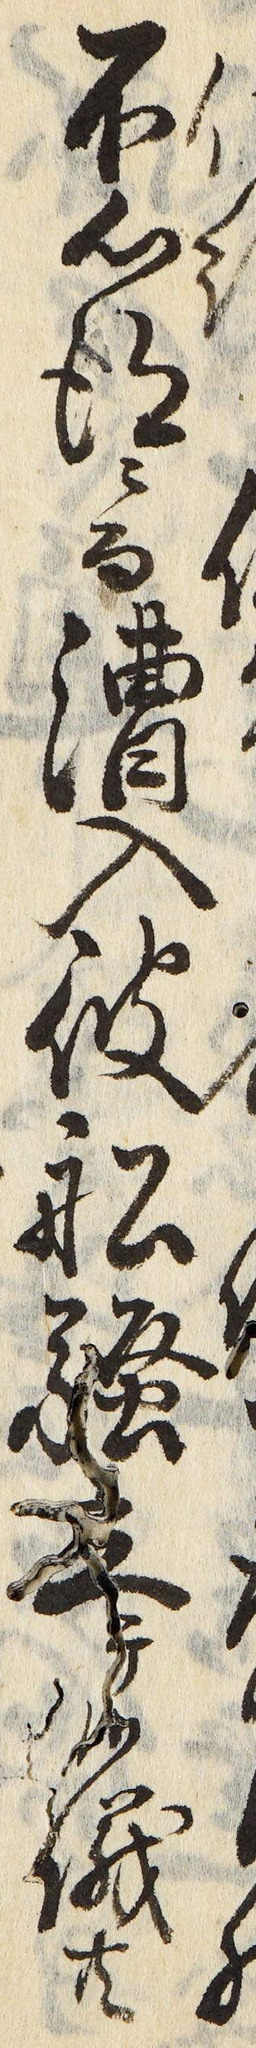不心得ニ而漕入彼船騒立テ候儀共
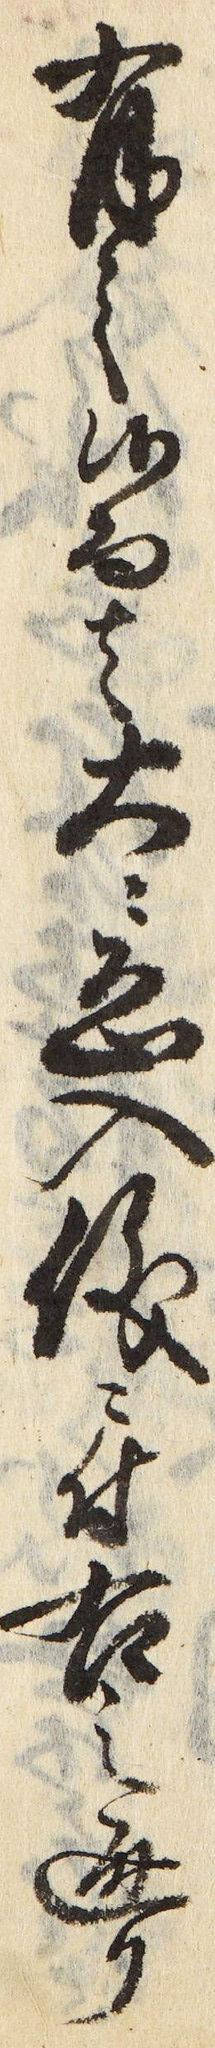有之候而者大ニ恐入儀ニ付右之通り

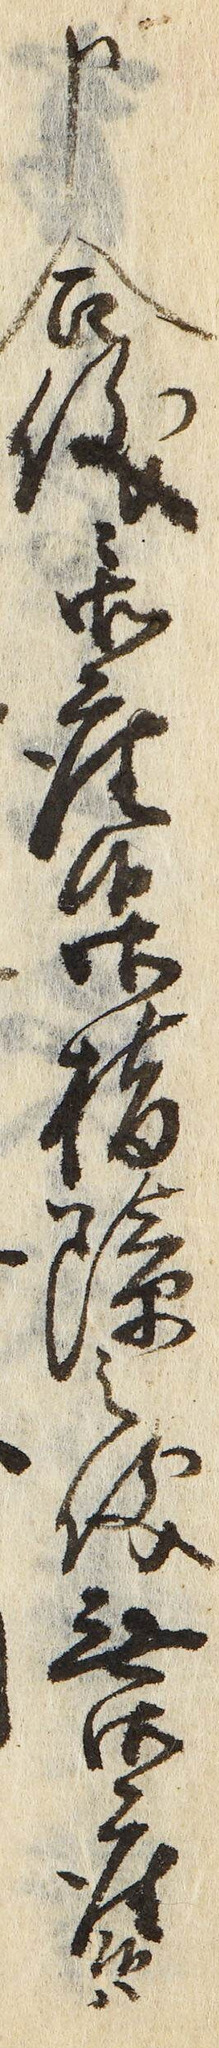申合儀ニ御座候御指障之儀無御座候ハ
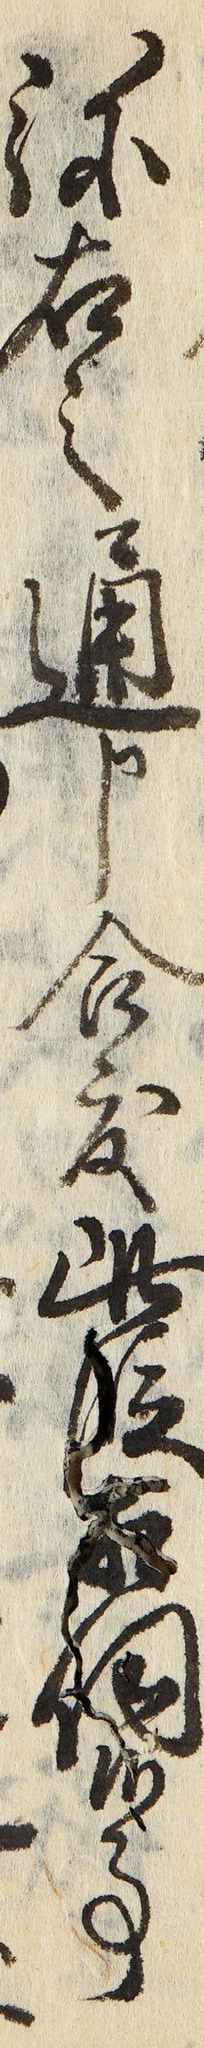弥右之通申合度此段相伺候事
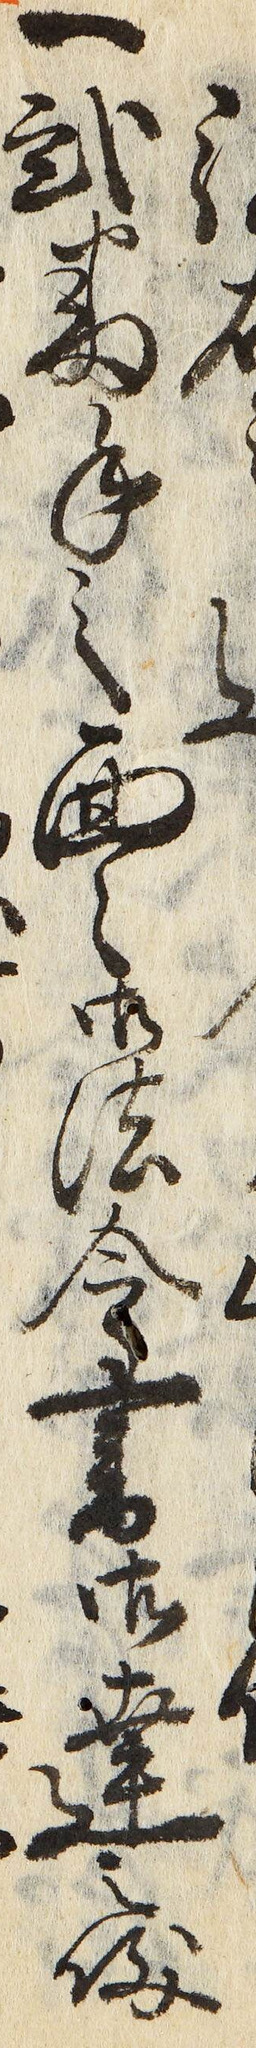一弐番手之面々御法令書御達之儀
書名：御領海江異国船漂流有之節御手当之次第大組頭心得之廉々書集記
